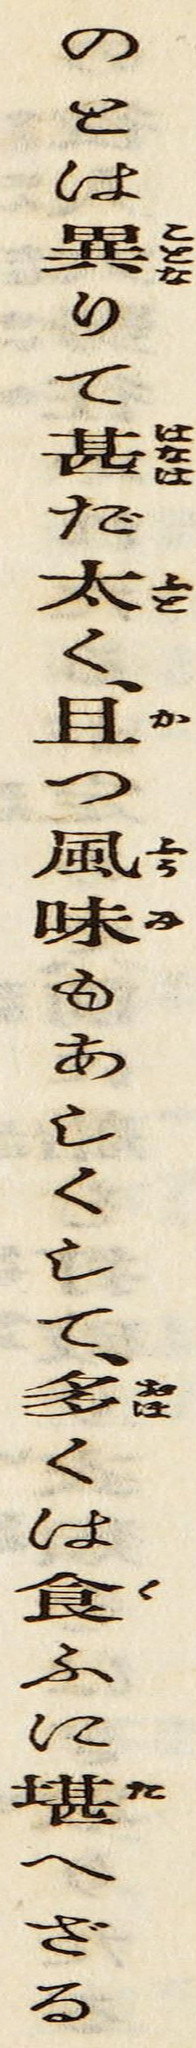のとは異りて甚だ太く、且つ風味もあしくして、多くは食ふに堪へざる
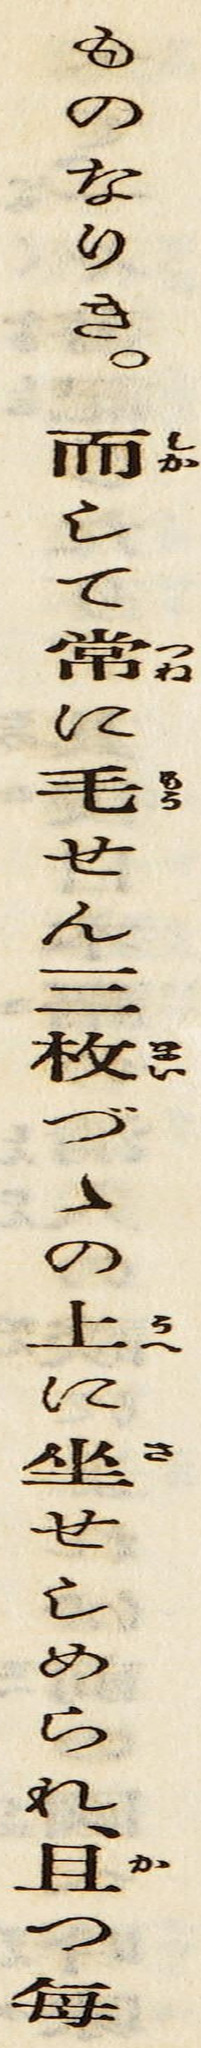ものなりき。而して常に毛せん三枚づゝの上に坐せしめられ、且つ毎
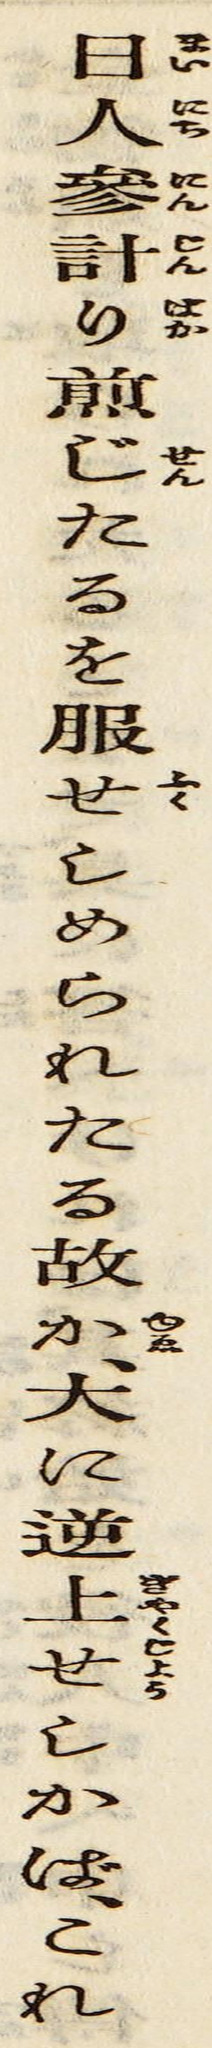毎日人参計り煎じたるを服せしめられたる故か、大に逆上せしかば
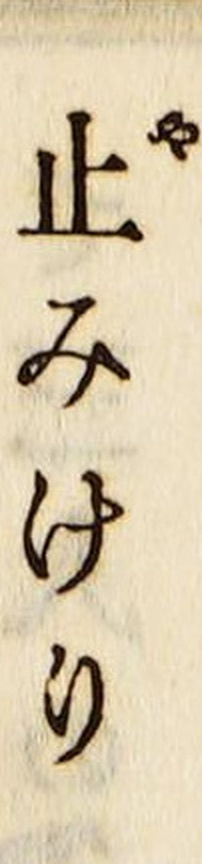止みけり
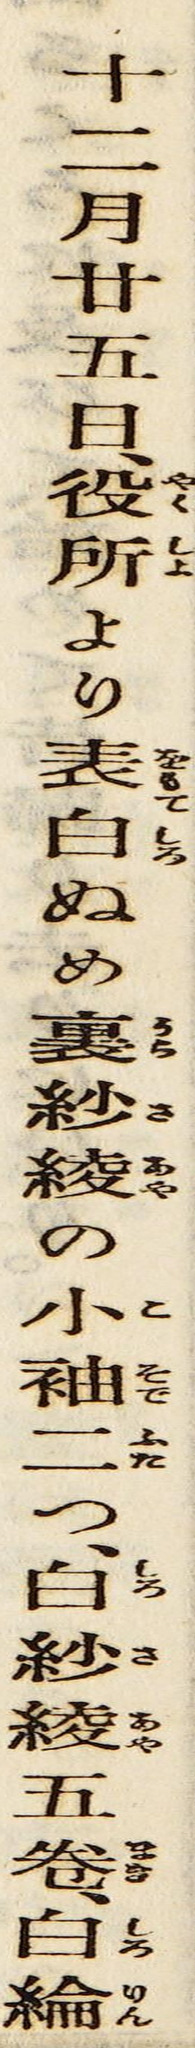十二月廿五日、役所より表白ぬめ裏紗綾の小袖二つ、白紗綾五巻、白綸
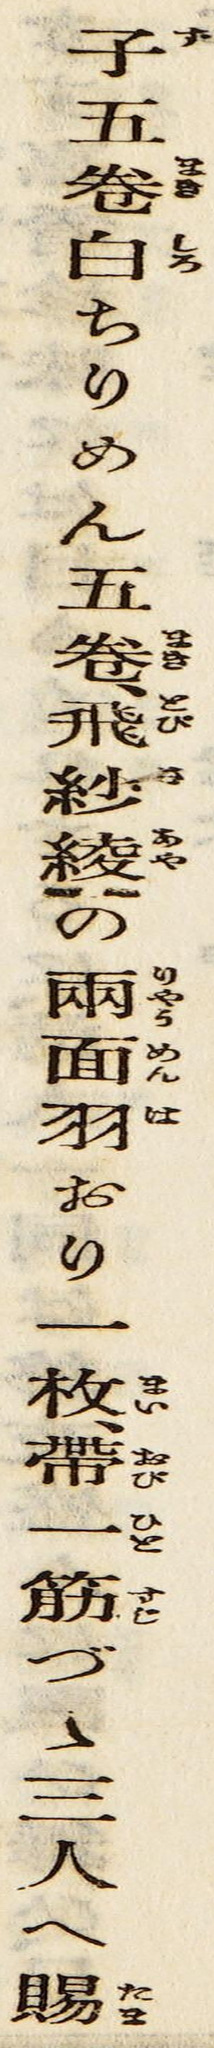子五巻白ちりめん五巻、飛紗綾の両面羽おり一枚、帯一筋づゝ三人へ賜
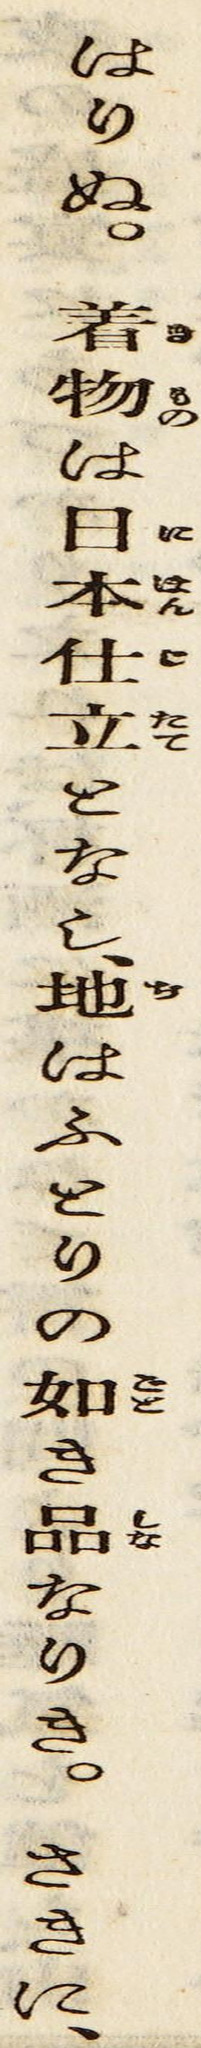はりぬ。着物は日本仕立となし、地はふとりの如き品なりき。さきに、
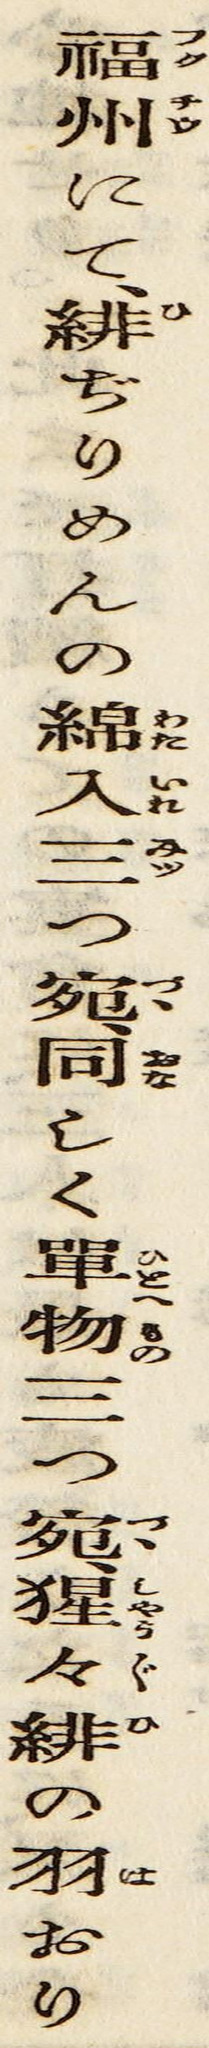福州にて、緋ぢりめんの綿入三つ宛、同しく単物三つ宛、猩々緋の羽おり
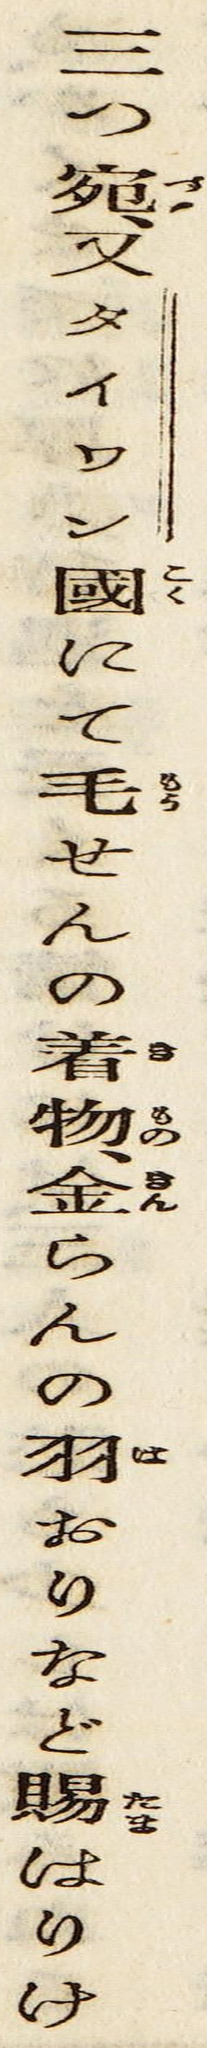三つ宛、又タイワン国にて毛せんの着物、金らんの羽おりなど賜はりけ
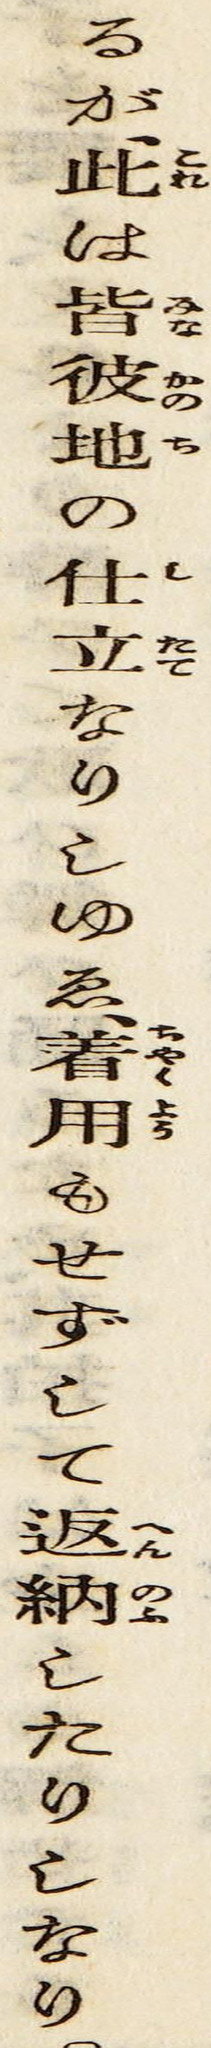るが、此は皆彼地の仕立なりしゆゑ、着用もせずして返納したりしなり。
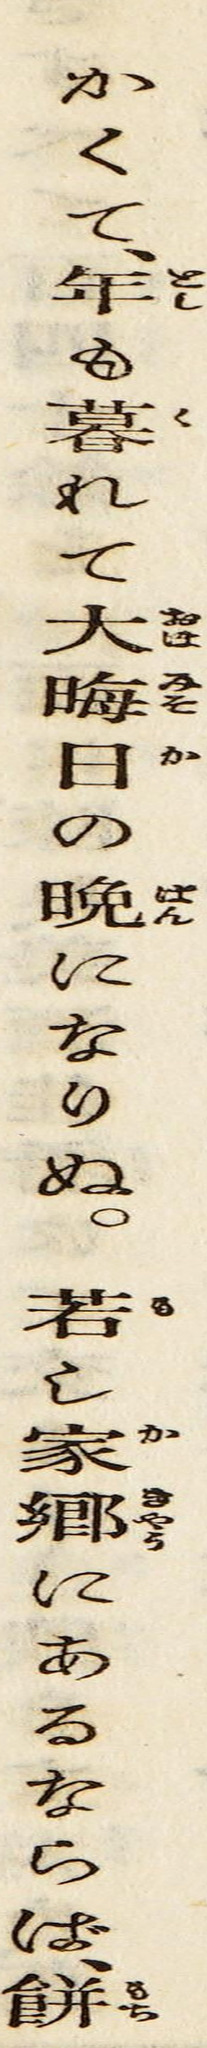かくて、年も暮れて大晦日の晩になりぬ。若し家郷にあるならば、餅
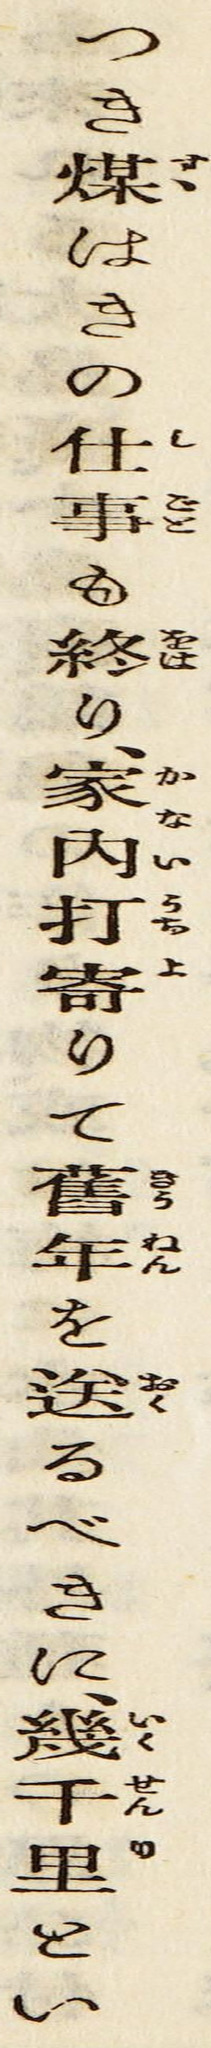つき煤はきの仕事も終り、家内打寄りて旧年を送るべきに、幾千里とい
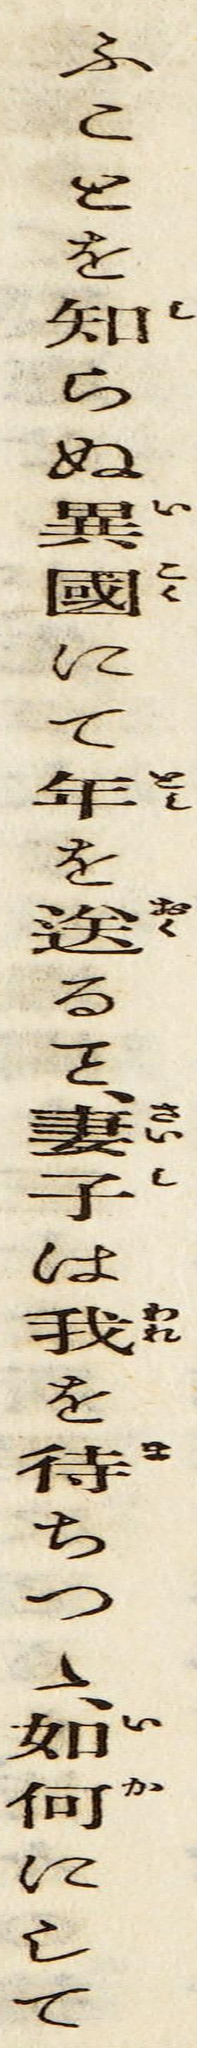ふことを知らぬ異国にて年を送ること、妻子は我を待ちつゝ、如何にして
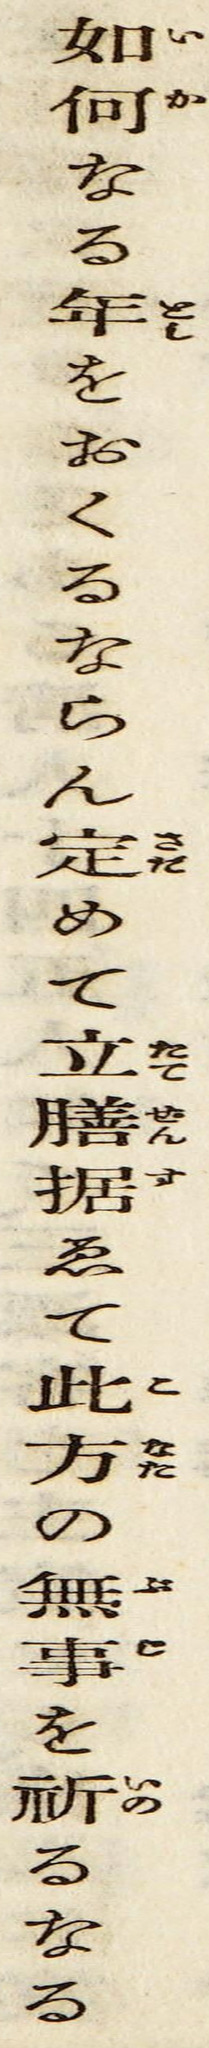如何なる年をおくるならん定めて立膳据ゑて此方の無事を祈るなる
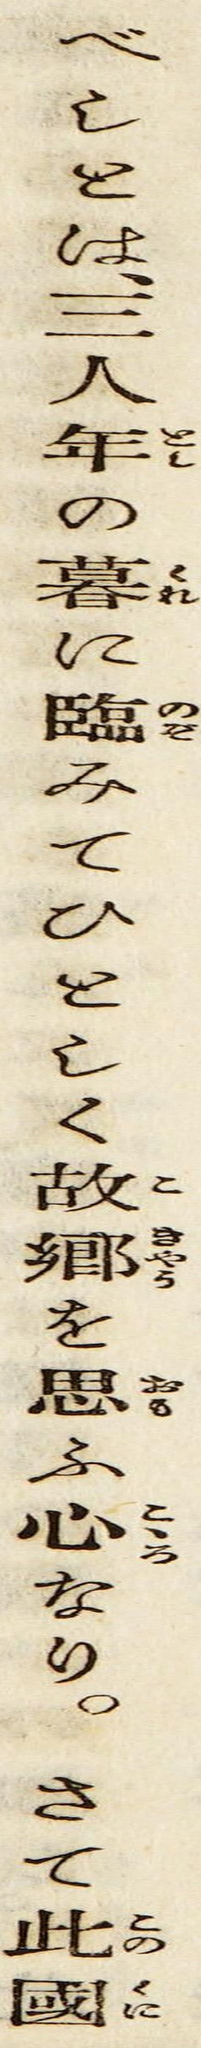べしとは、三人年の暮に臨みてひとしく故郷を思ふ心なり。さて此国
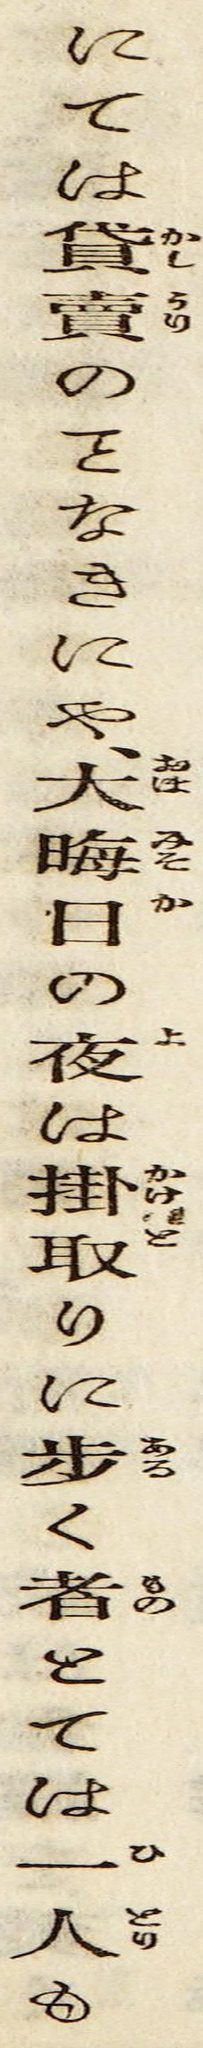にては貸売のことなきにや、大晦日の夜は掛取りに歩く者とては一人も
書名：日本漂流譚
